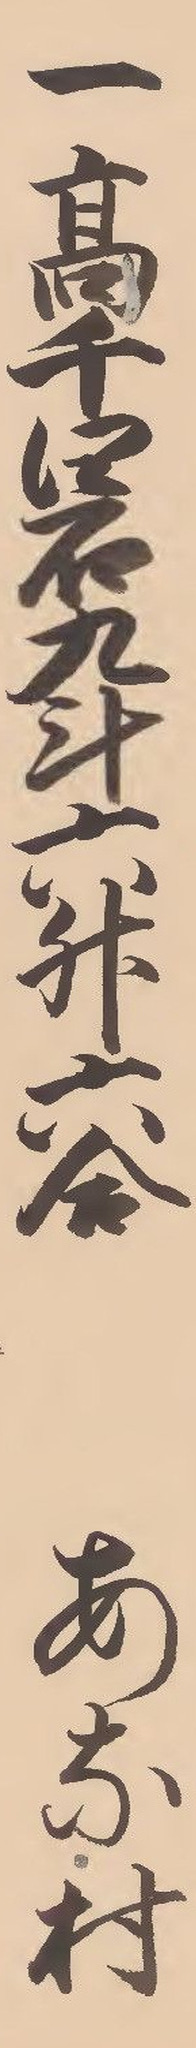一高千四石九斗六升六合あな村
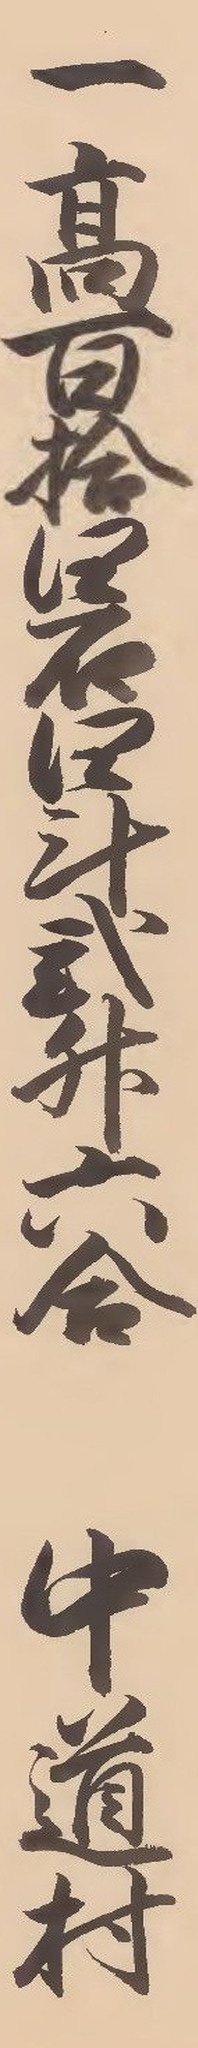一高百拾四石四斗弐升六合中道村
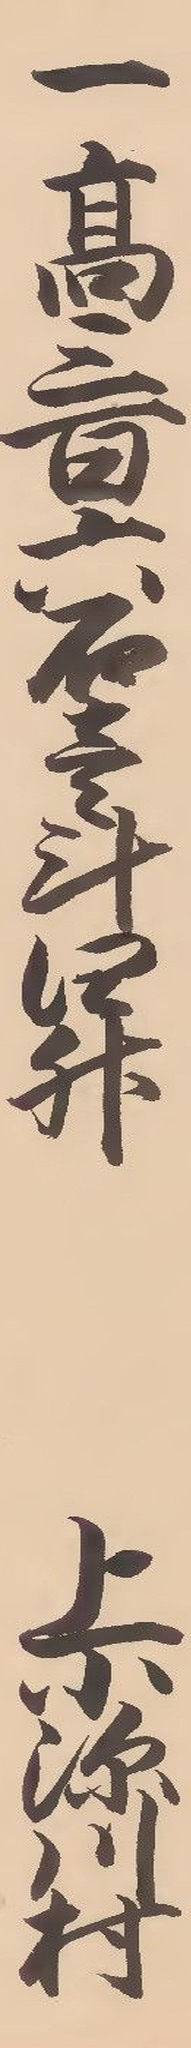一高三百六石壱斗四升上小深川村
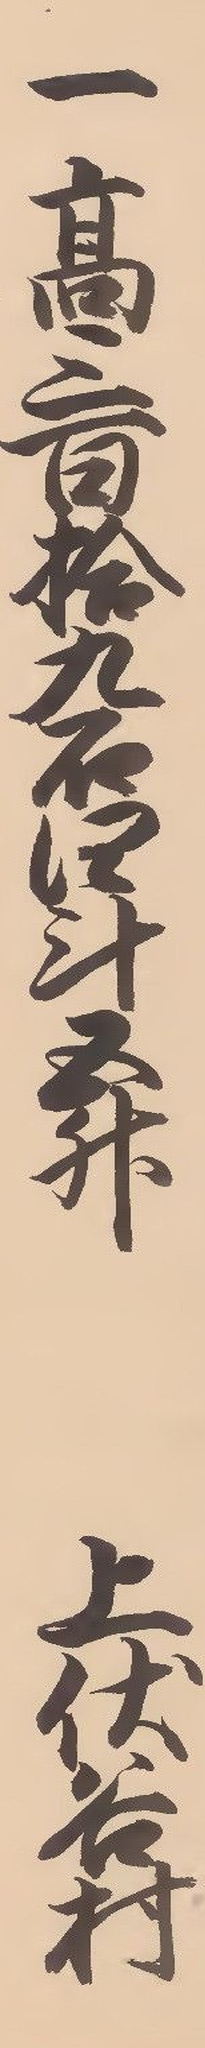一高三百拾九石四斗五升上伏谷村
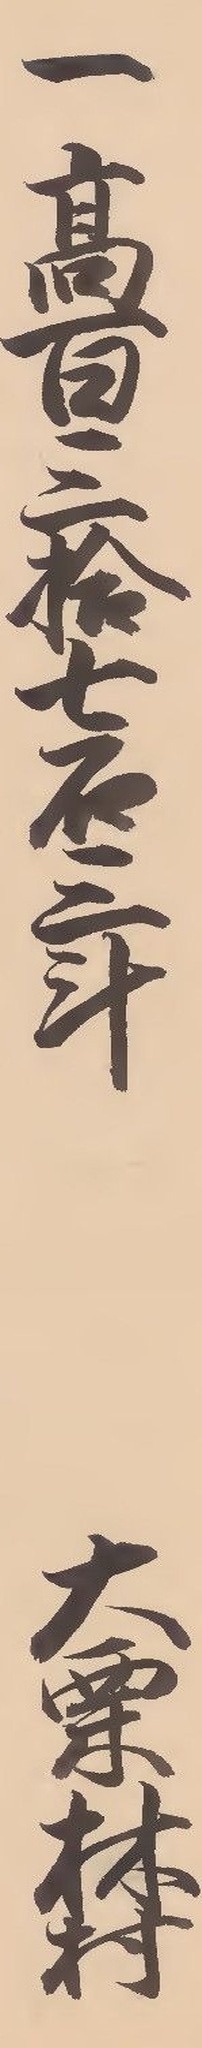一高百三拾七石三斗大栗林村
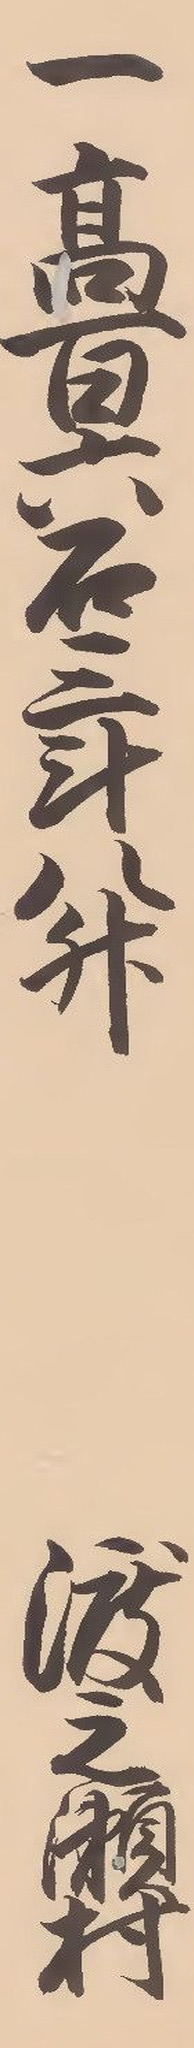一高百六石三斗八升渡之瀬村
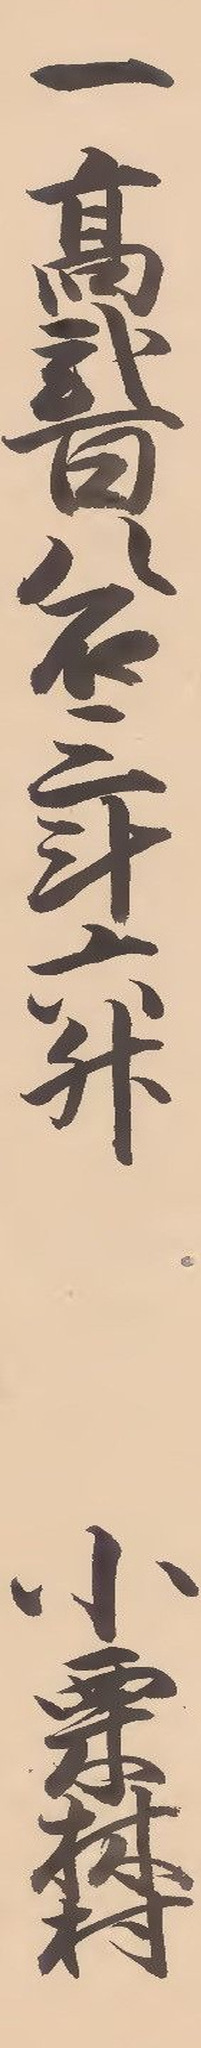一高弐百八石三斗六升小栗林村

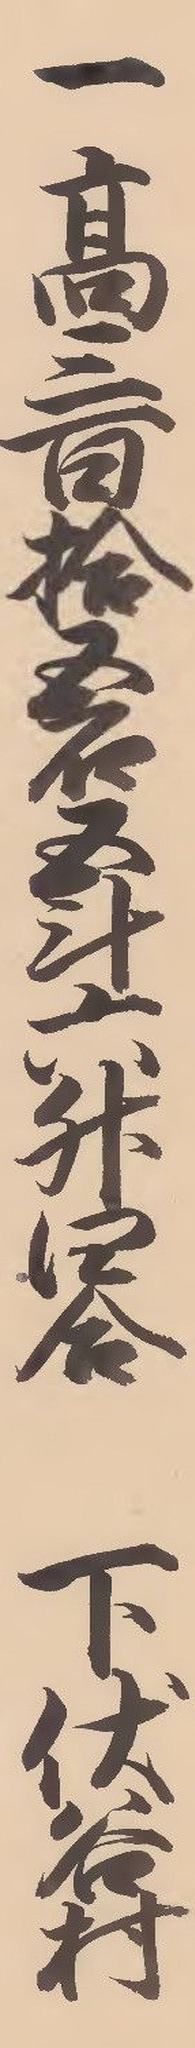一高三百拾五石五斗六升四合下伏谷村
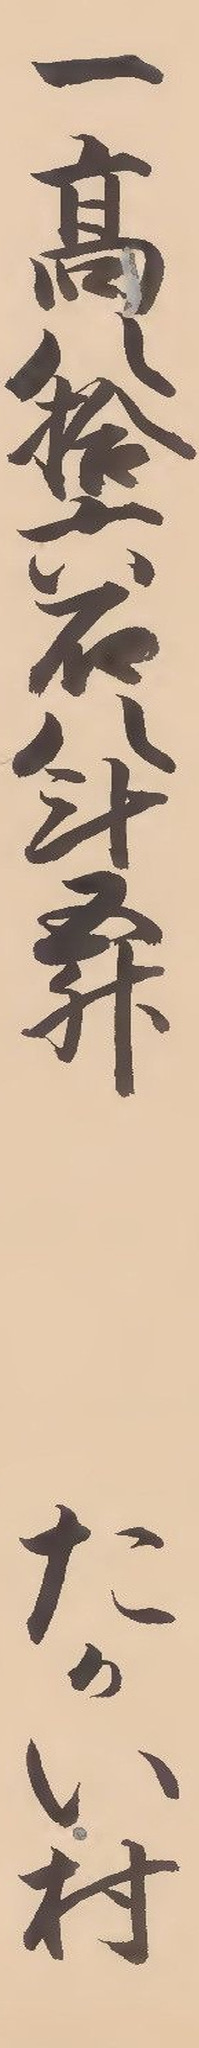一高八拾六石八斗五升たかい村
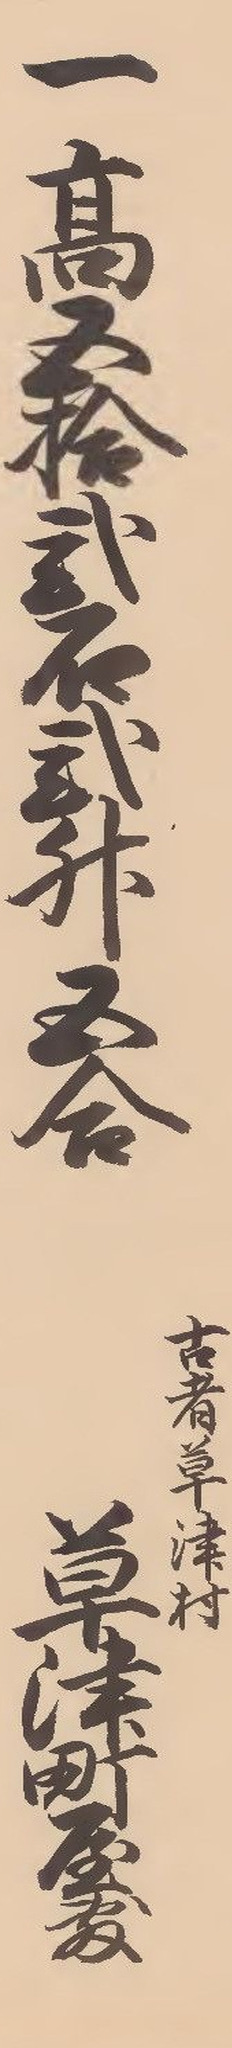一高五拾弐石弐升五合草津町屋敷
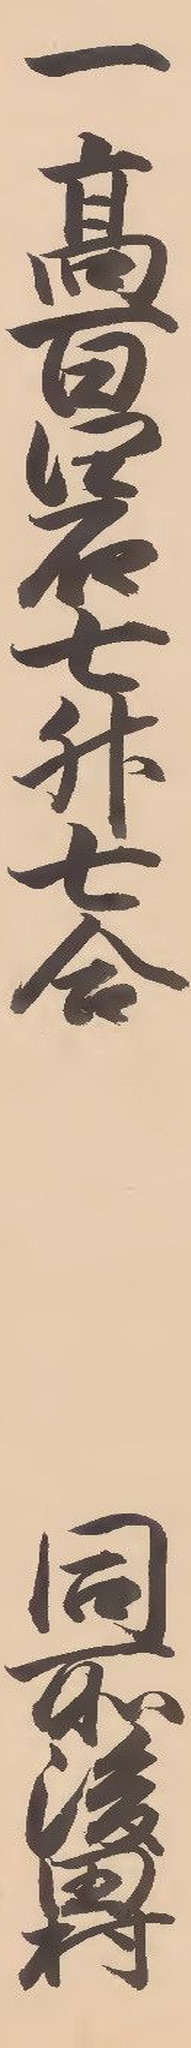一高百四石七升七合同所後田村
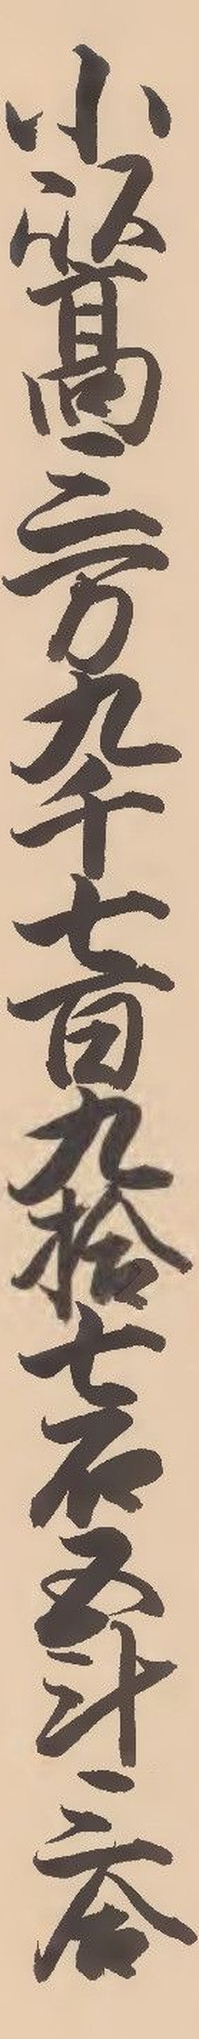小以高三万九千七百九拾七石五斗三合

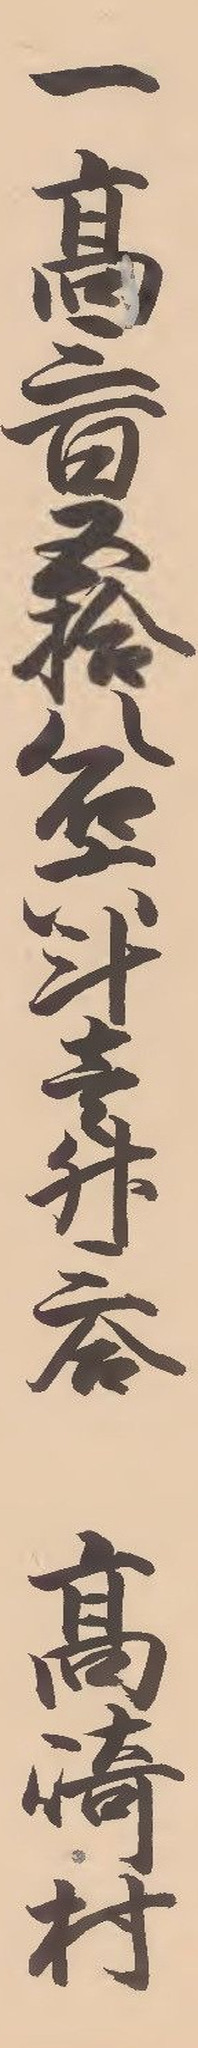一高三百五拾八石六斗壱升三合高崎村
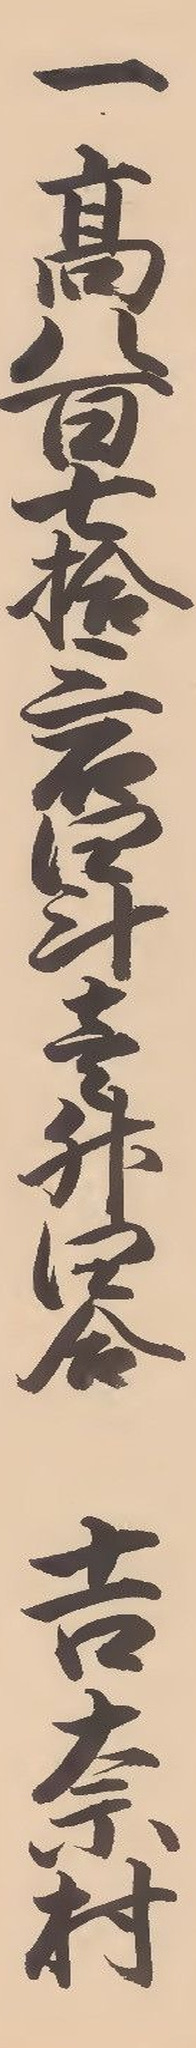一高八百七拾三石四斗壱升四合吉奈村
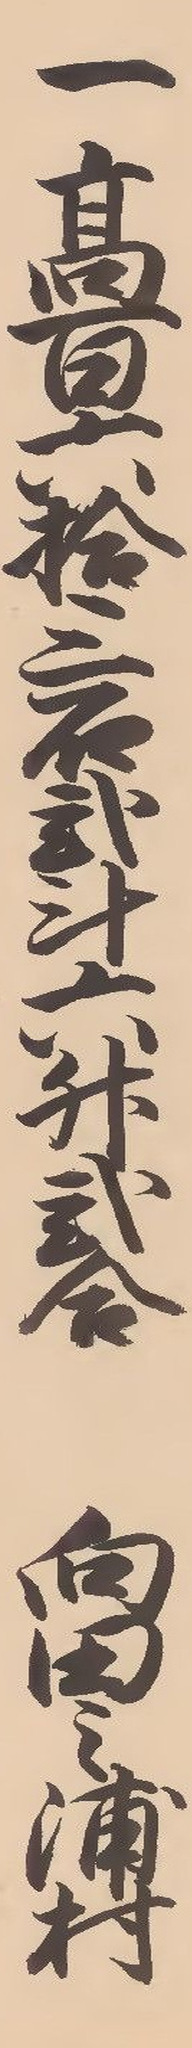一高百六拾三石弐斗六升弐合向田之浦村
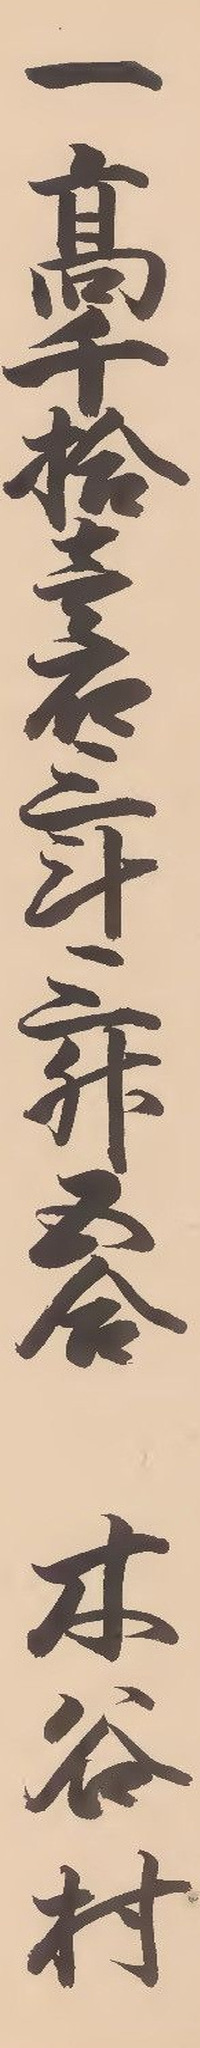一高千拾壱石三斗三升五合木谷村
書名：安芸国郷帳
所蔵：国立公文書館 National Archives of Japan
